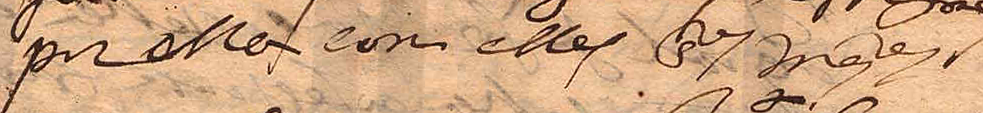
por ella com elles Sres Jnqres
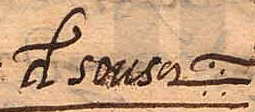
d̄ sousa
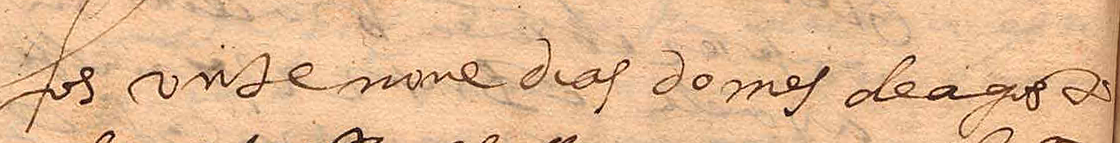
Aos vinte noue dias do mes de agosto
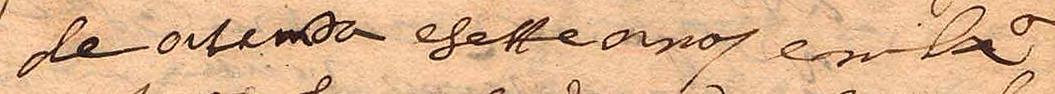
de oitenta e sette anos en Lxa
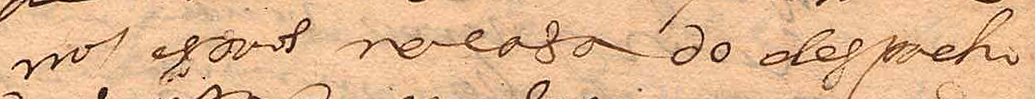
nos estaos na casa do despacho
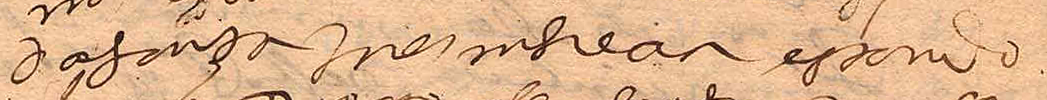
da santa Jnquisican estando
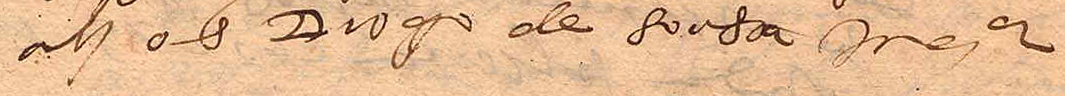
alj o s̄ Diogo de sousa Jnqor
